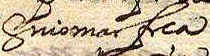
Guiomar frca
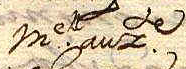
mel. auz.te
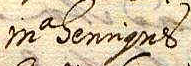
ma henriques
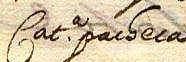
Cat.a pacheca
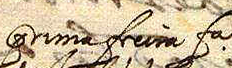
prima freira fa.
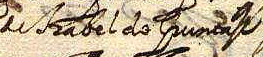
de Izabel do Quintal
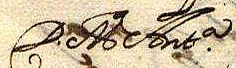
D. Ma Ant.a
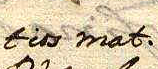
tios mat.
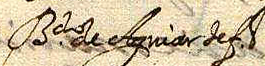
B.do de Aguiar def.
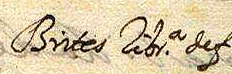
Brites Ribr.a def.
